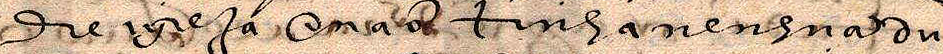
dre igreJa e naõ tinha nenhuā du
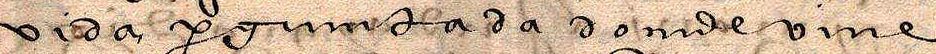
vida ꝑgumtada domde viue
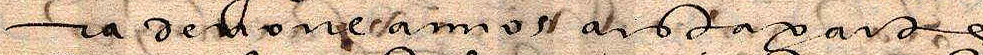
ra de noue annos a esta parte
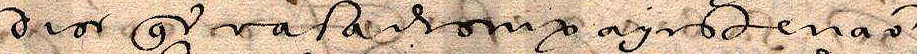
dise q̄ ē casa de seu pay esteuaõ
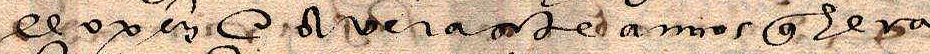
llopez e Avera sete annos q̄ he ca
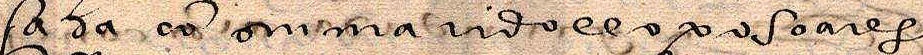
sada cō seu marido llopo soares
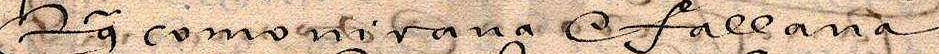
E q̄ comonicaua e fallaua
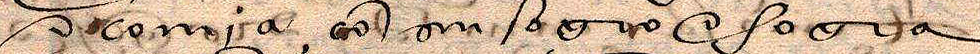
e comja cō seu sogro e sogra
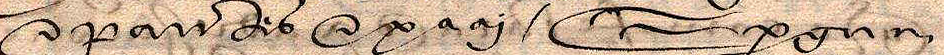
e parētes e paaj / E ꝑgum
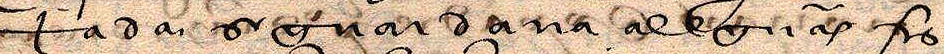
tada se guardaua allguās fes
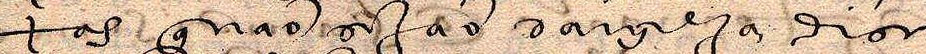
tas q̄ naõ seJaõ da igreJa dise
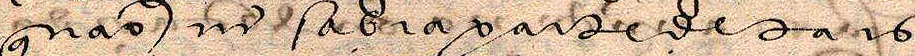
q̄ naõ nē sabia parte de taes
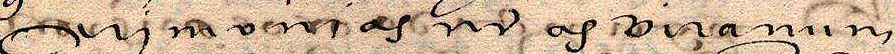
Çerjmonias nē as vira num
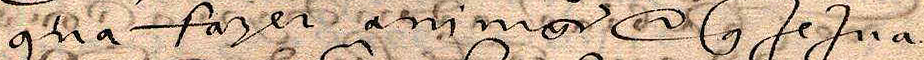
qua fazer a nimgē e q̄ JeJua
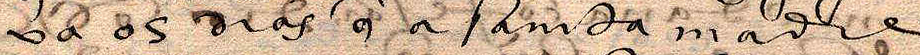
va os dias q̄ a samta madre
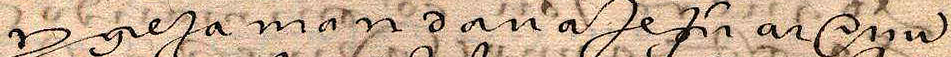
ygreJa mandaua a JeJūar e nū
